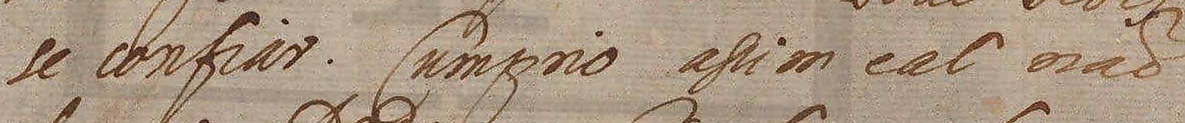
se confiar. Cumprio assim e al naõ
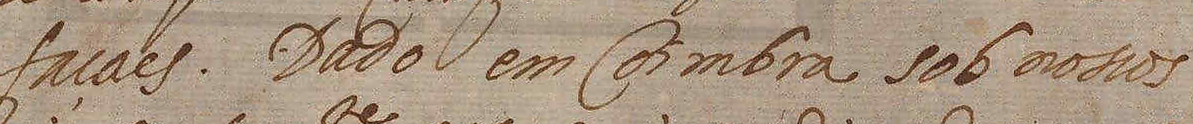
façaes. Dado em Coimbra, sob nossos
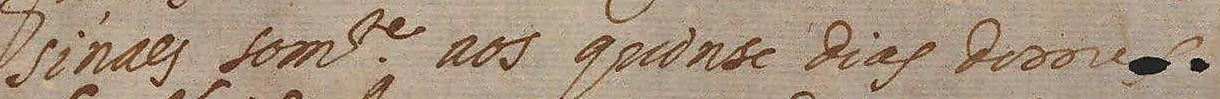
sinaes som.te aos quinse dias do mes
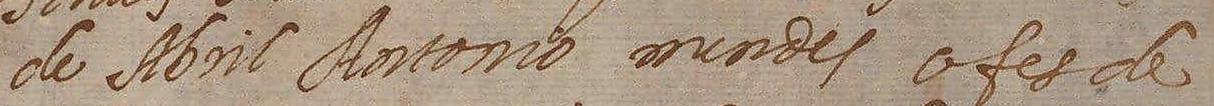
de Abril Antonio mendes o fes de
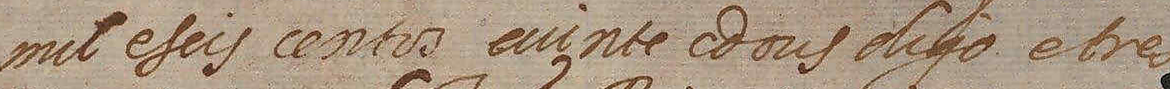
mil e seiscentos e uinte e dous digo e tres
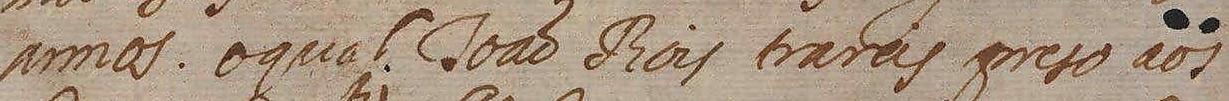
annos. o qual Ioaõ Rois trareis preso aos
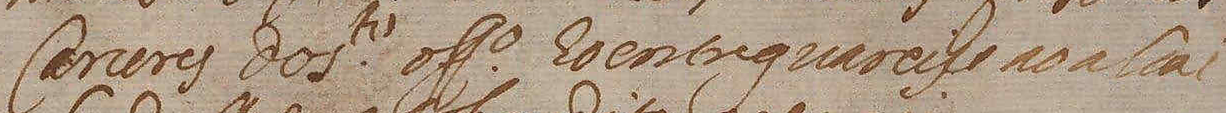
Carceres do s.to off.o, e o entreguareis ao alcai
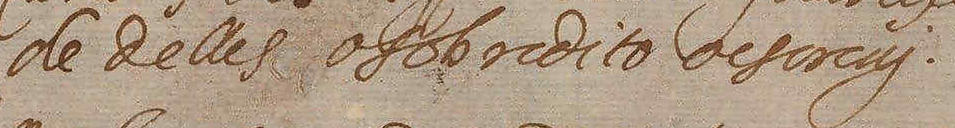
de delles o sobredito o escreuj.
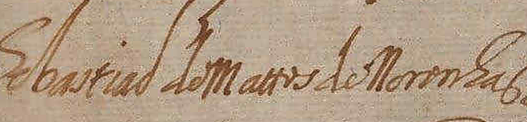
Sebastiaõ do Mattos de Noronha
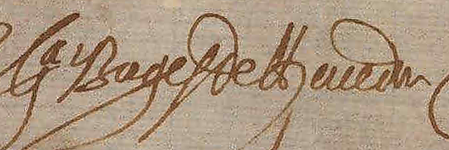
Gar Borges de Azeuedo
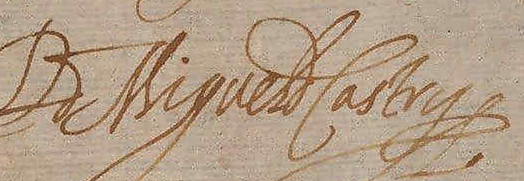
Dō Miguel d Castro
